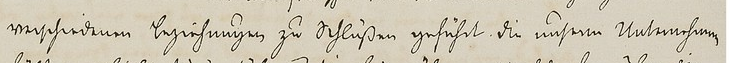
verschiedenen Beziehungen zu Schlüßen geführt die unsererm Unternehmen
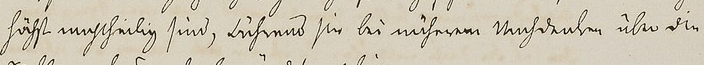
höchst nachtheilig sind, während Sie bei näherem Nachdenken über die
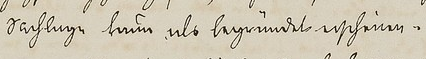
Sachlage kaum als begründet erscheinen.
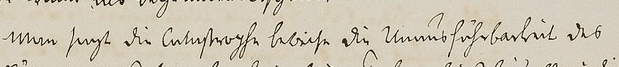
Man sagt die Catastrophe beweise die Unausführbarkeit des
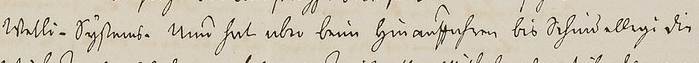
Wetli-Systems. Nun hat aber beim Hinauffahren bis Schindellegi die
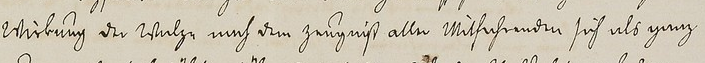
Wirkung der Walze nach dem Zeugniß aller Mitfahrenden sich als ganz
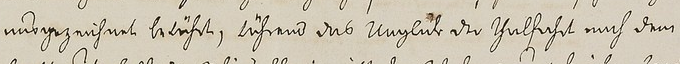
ausgezeichnet bewährt, während das Unglük der Thalfahrt nach dem
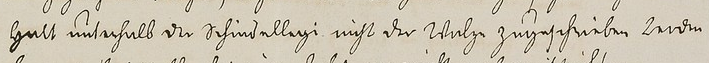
Halt unterhalb der Schindellegi nicht der Walze zugeschrieben werden
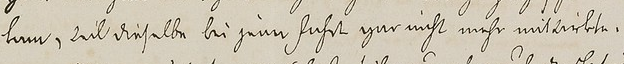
kann, weil dieselbe bei jener Fahrt gar nicht mehr mitwirkte.
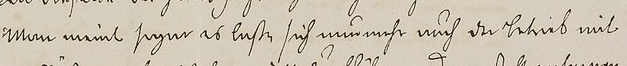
Man wird sagen es laße sich nunmehr auch der Betrieb mit
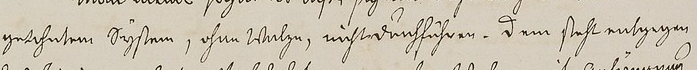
gewohntem System, ohne Walze, nicht durchführen. Dem steht entgegen
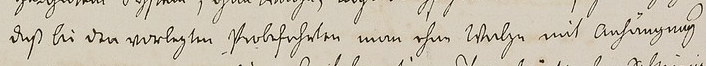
daß bei den vorlezten Probefahrten man ohne Walze mit Anhängung
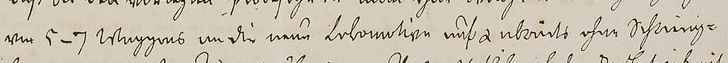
von 5-7 Waggons an die neue Lokomotive auf & abwärts ohne Schwierig-
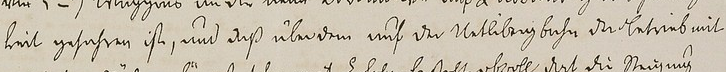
keit gefahren ist, und daß überdem auf der Uetlibergbahn der Betrieb mit
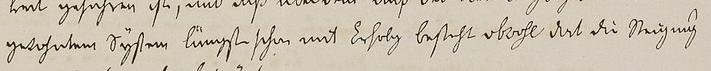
gewohntem System längst schon mit Erfolg besteht obwohl dort die Steigung
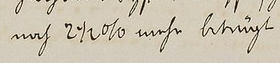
noch 2½% mehr beträgt.
